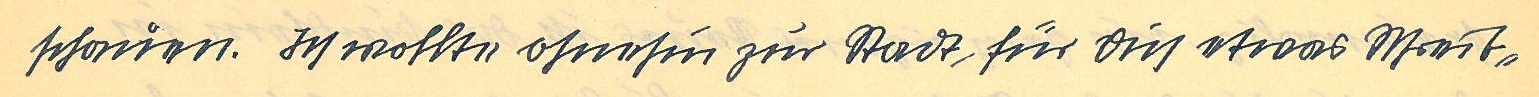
schauen. Ich wollte ohnehin zur Stadt, für Dich etwas Schreib¬
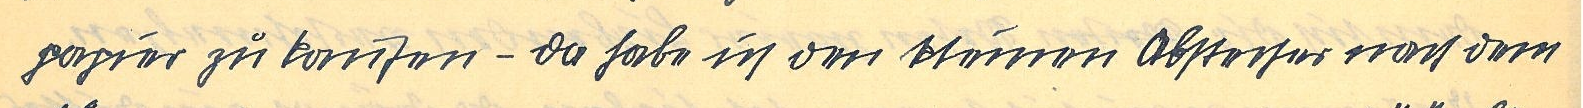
papier zu kaufen – da habe ich den kleinen Abstecher nach dem
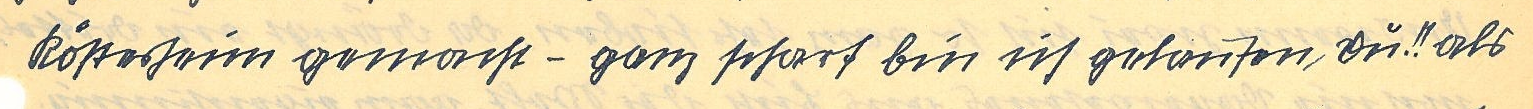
Kösterheim gemacht – ganz scharf bin ich gelaufen, Du!! als
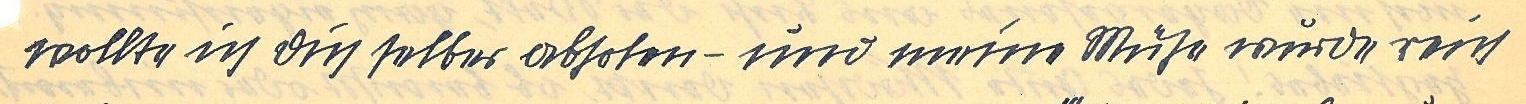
wollte ich Dich selber abholen – und meine Mühe wurde reich
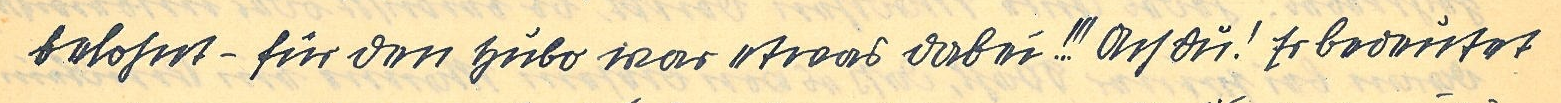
belohnt – für den Hubo war etwas dabei!!! Ach Du! Er bedeutet
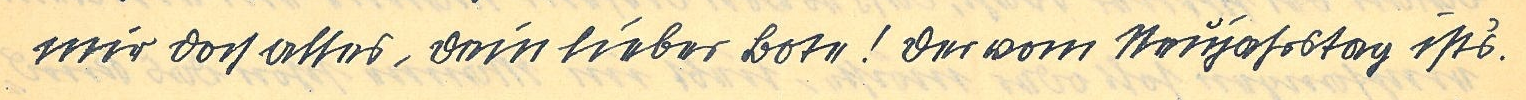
mir doch alles, Dein lieber Bote! Der vom Neujahrstag ist’s.
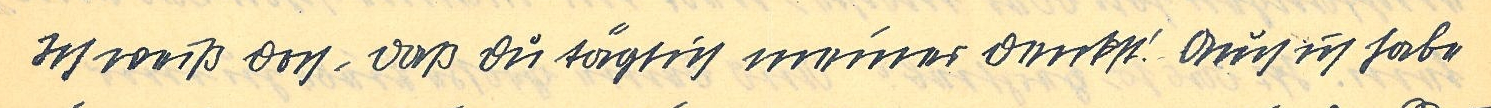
Ich weiß doch, daß Du täglich meiner denkst! Auch ich habe
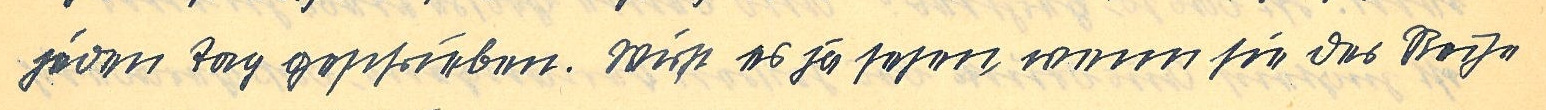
jeden Tag geschrieben. Wirst es ja sehen, wenn sie der Reihe
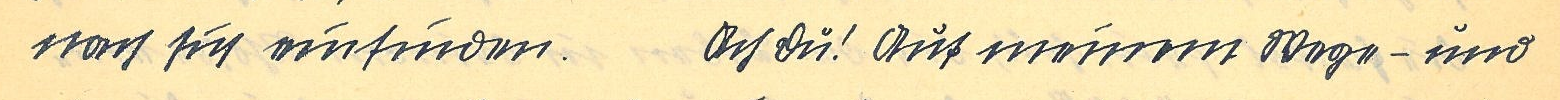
nach sich einfinden. Ach Du! Auf meinem Wege – und
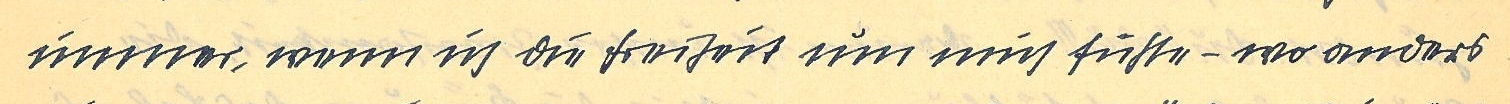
immer, wenn ich die Freiheit um mich fühle – wo anders
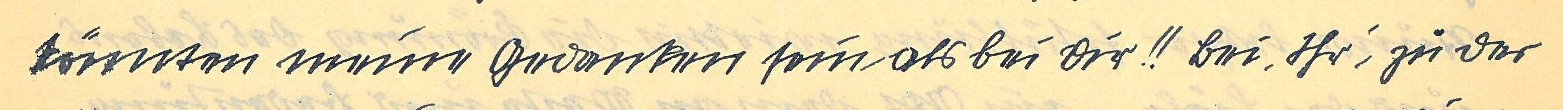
könnten meine Gedanken sein, als bei Dir!! Bei ‘Ihr’, zu der
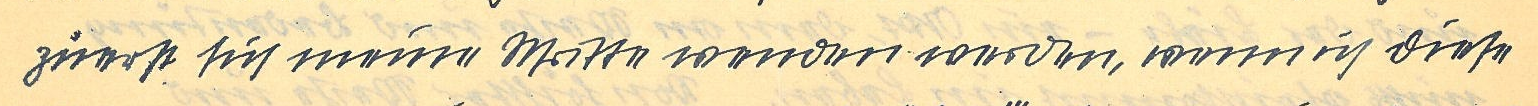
zuerst sich meine Schritte wenden werden, wenn ich diese
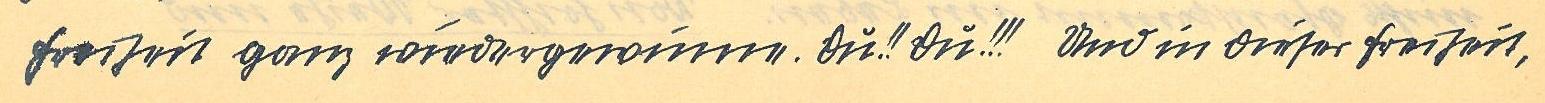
Freiheit ganz wiedergewinne. Du!! Du!!! Und in dieser Freiheit,
